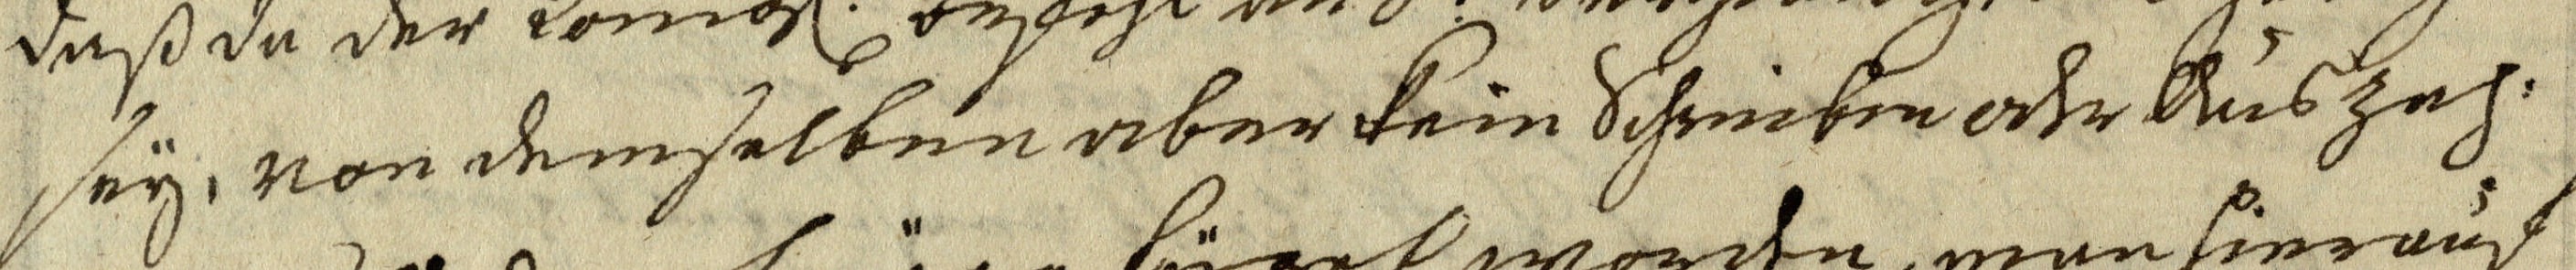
seÿ, von demselben aber kein Schreiben oder Auszah¬
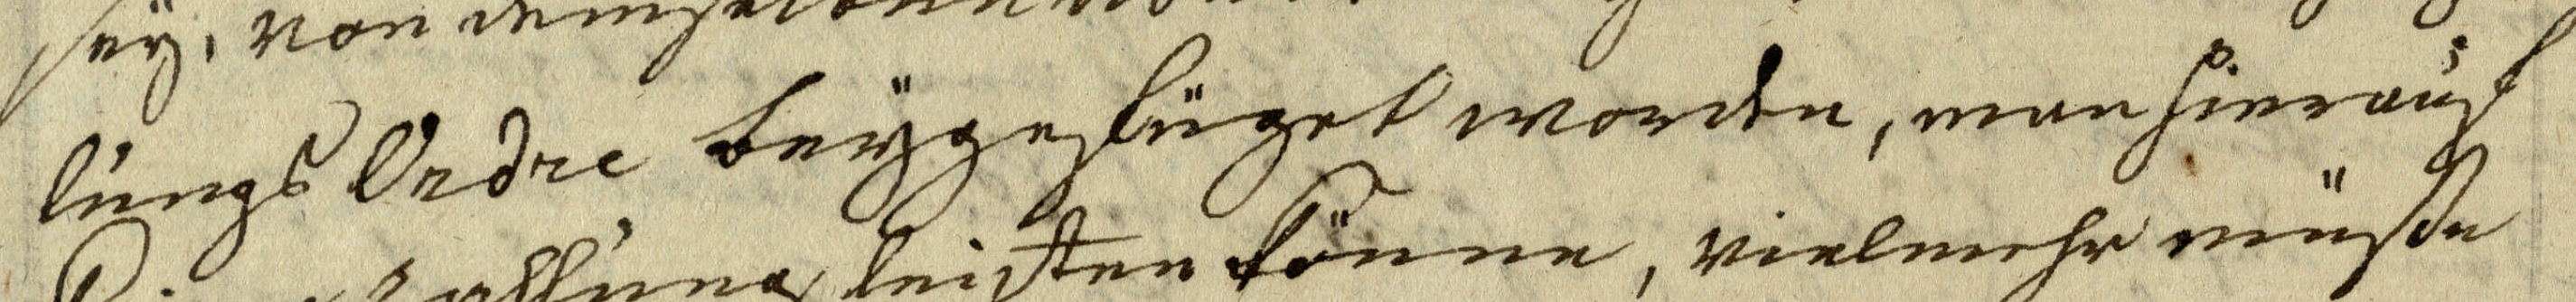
lungs Ordre beÿgefüget worden, man hierauf
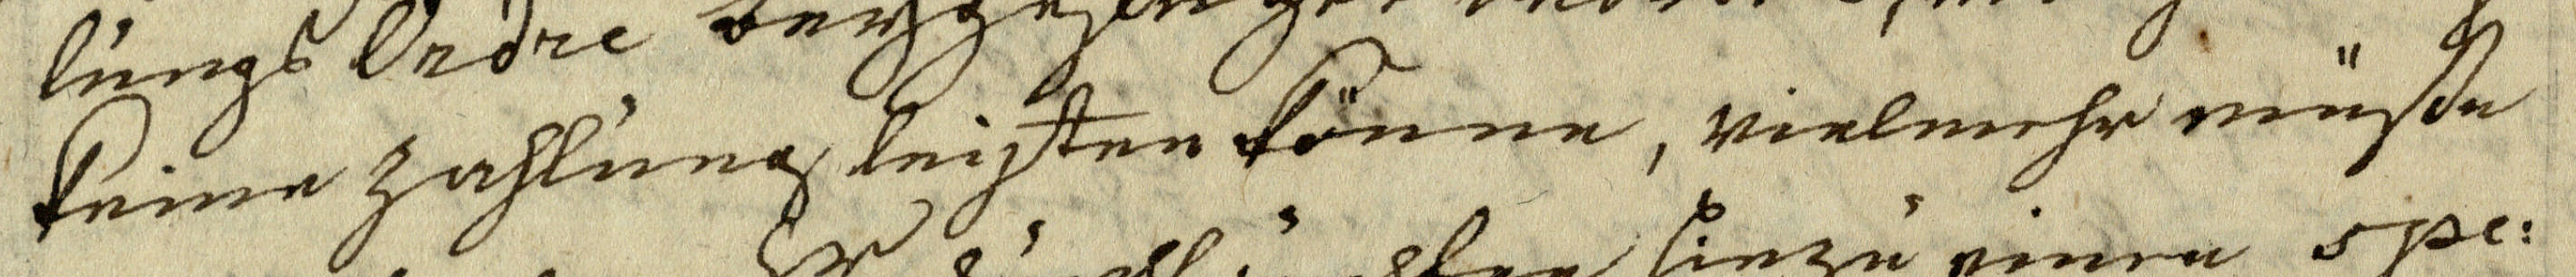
keine Zahlung leisten könne, vielmehr müße
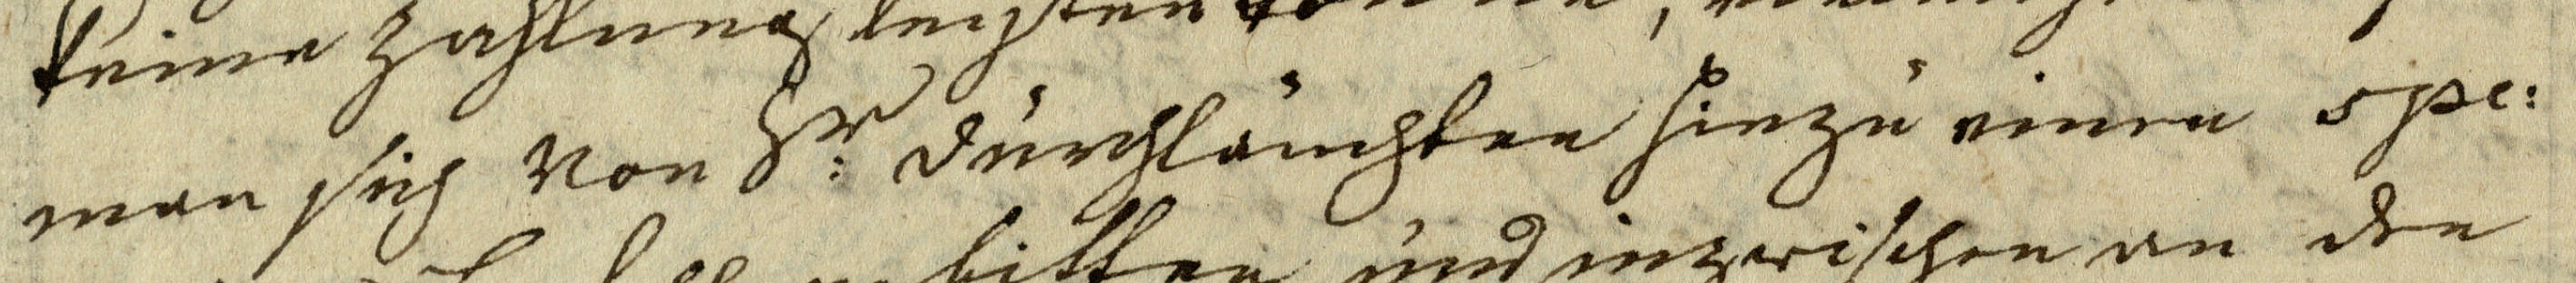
man sich von Sr Durchlauchten hiezu einen spe¬
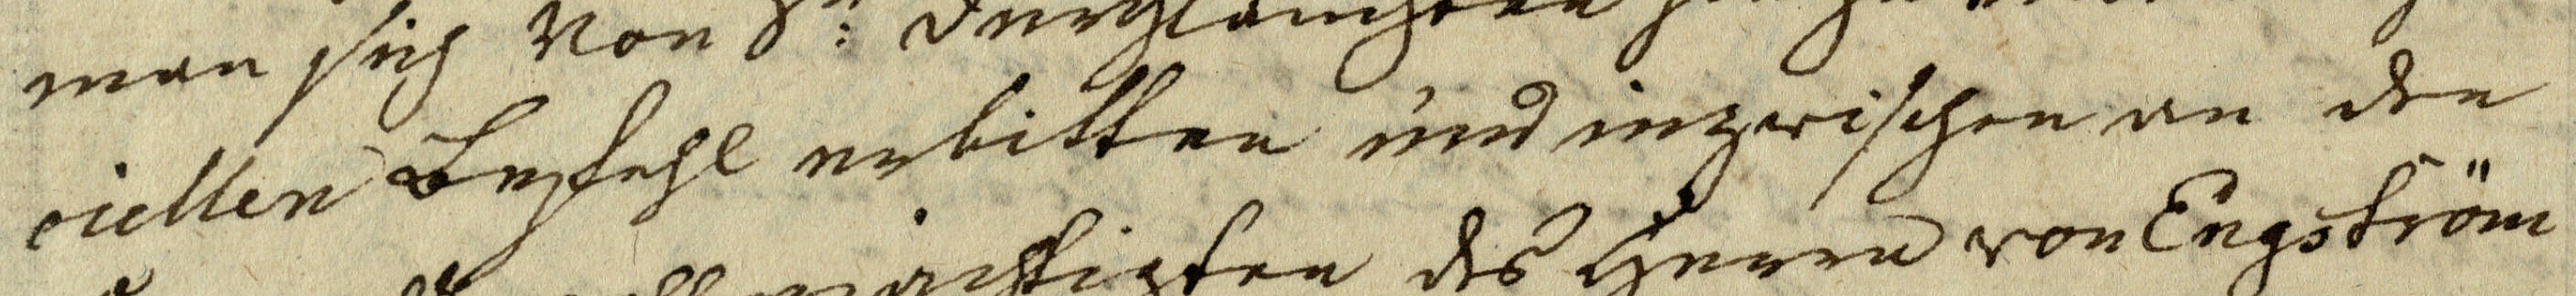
ciellen Befehl erbitten und inzwischen den
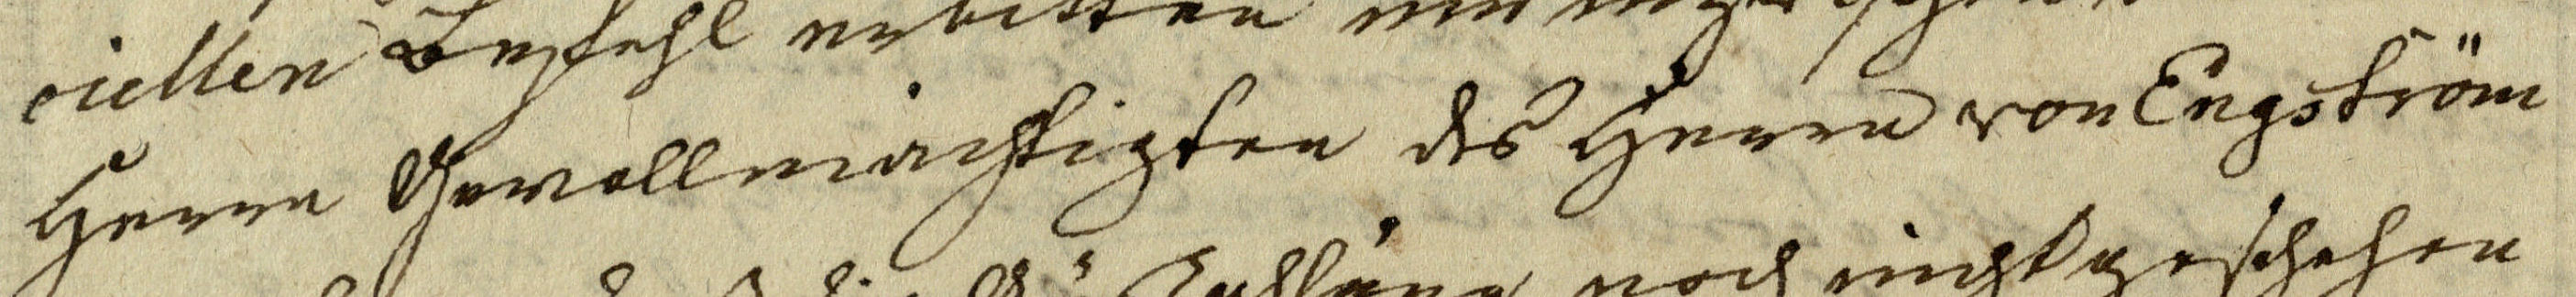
Herrn Gevollmächtigten des Herrn von Engström
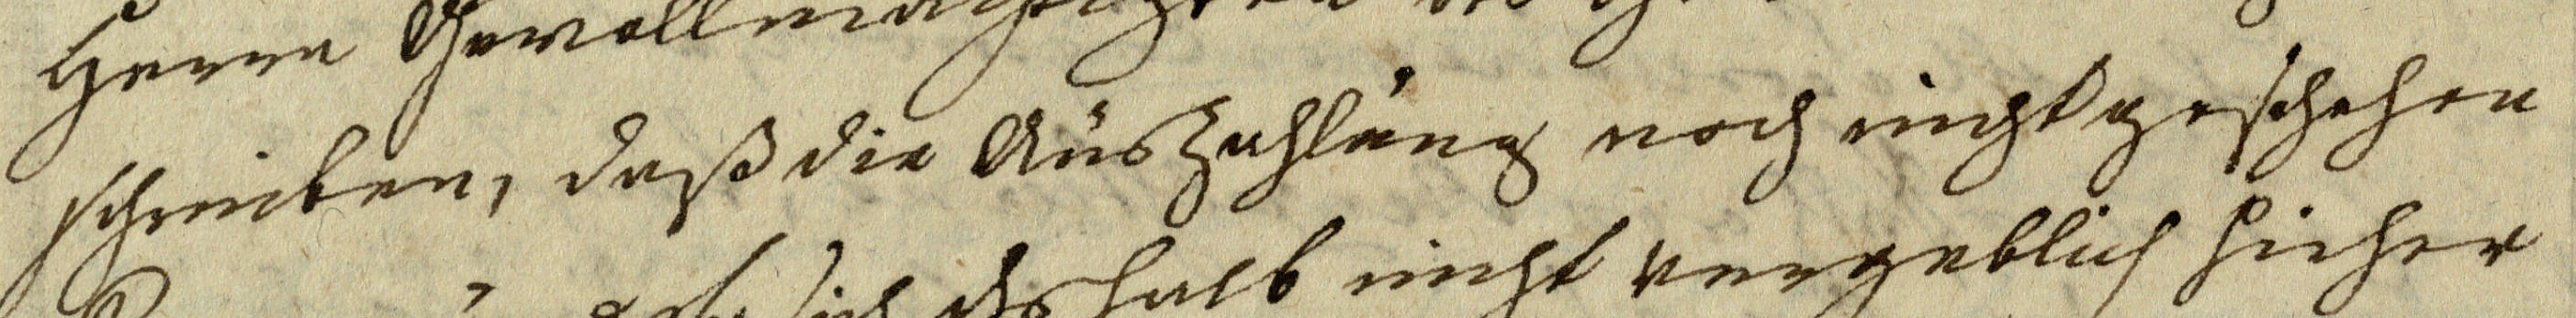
schreiben, daß die Auszahlung noch nicht geschehen
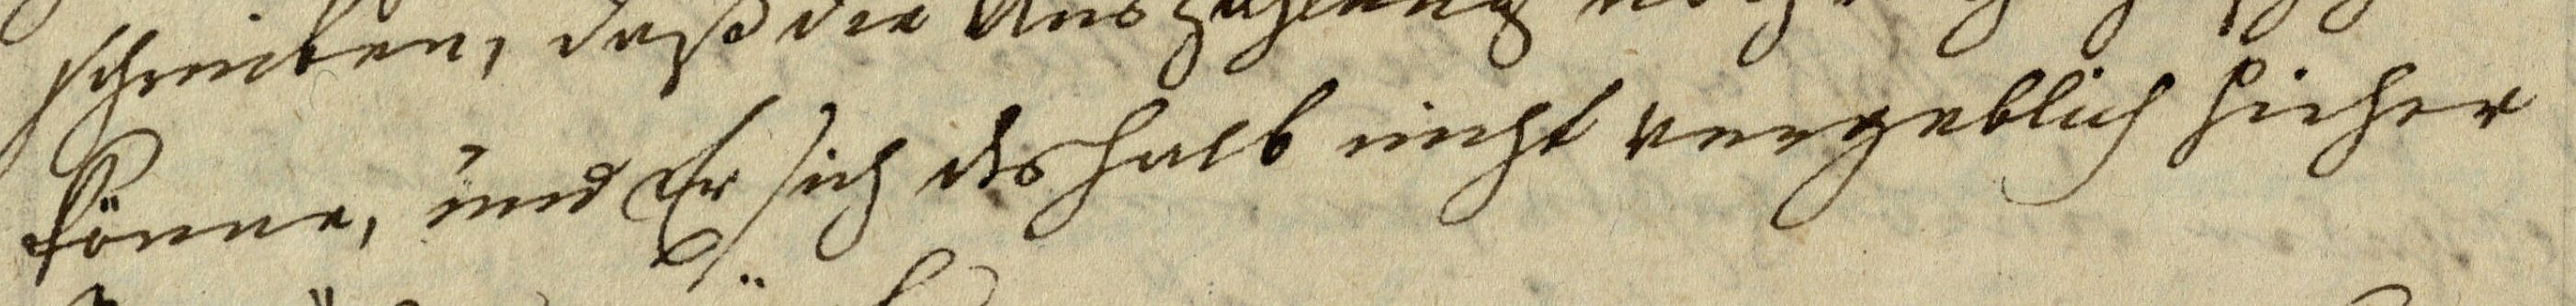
könne, und Er sich deshalb nicht vergeblich hieher
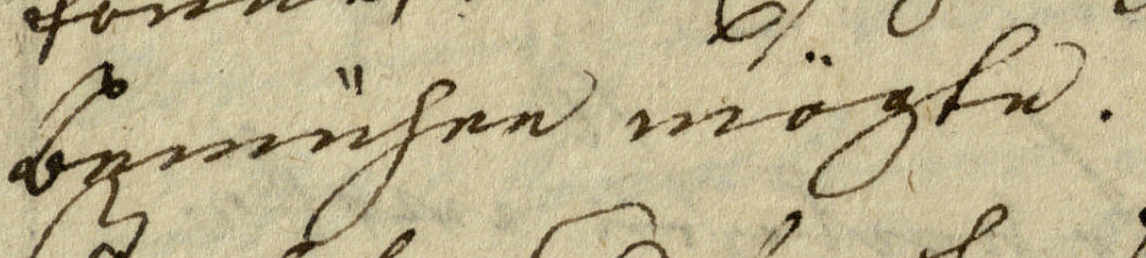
bemühen mögte.
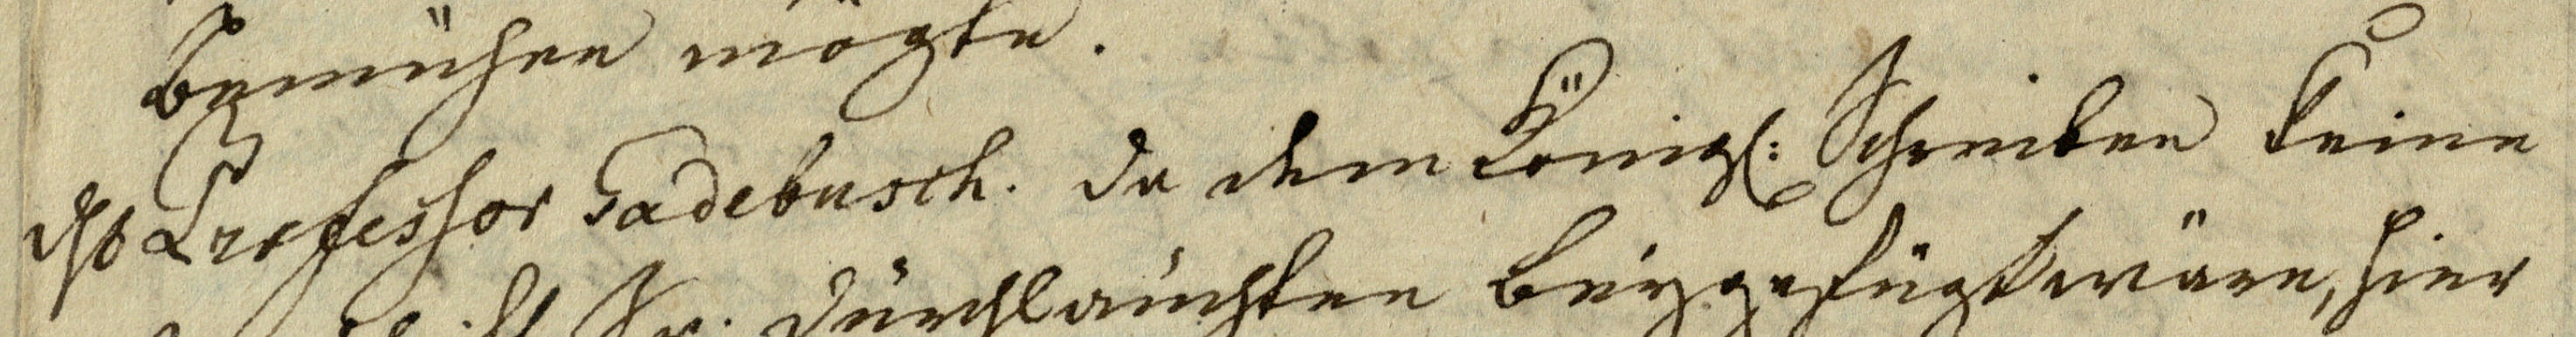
dh. Professor Gadebusch. da dem Königl. Schreiben keine
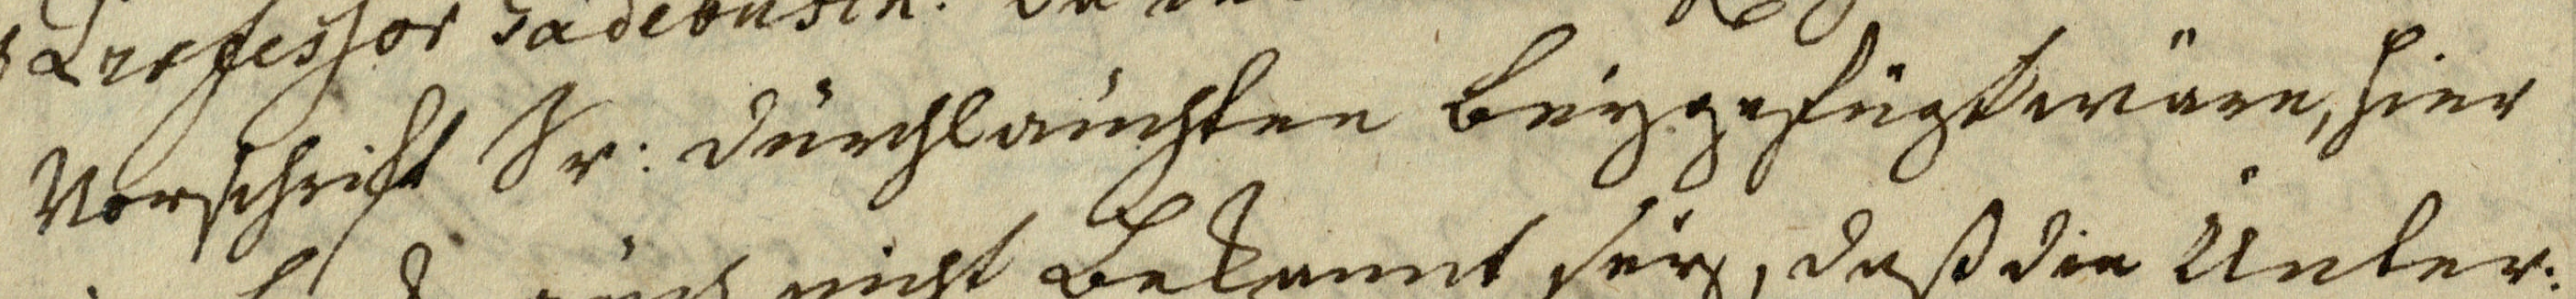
Vorschrift Sr Durchlauchten beÿgefügt wäre, hier
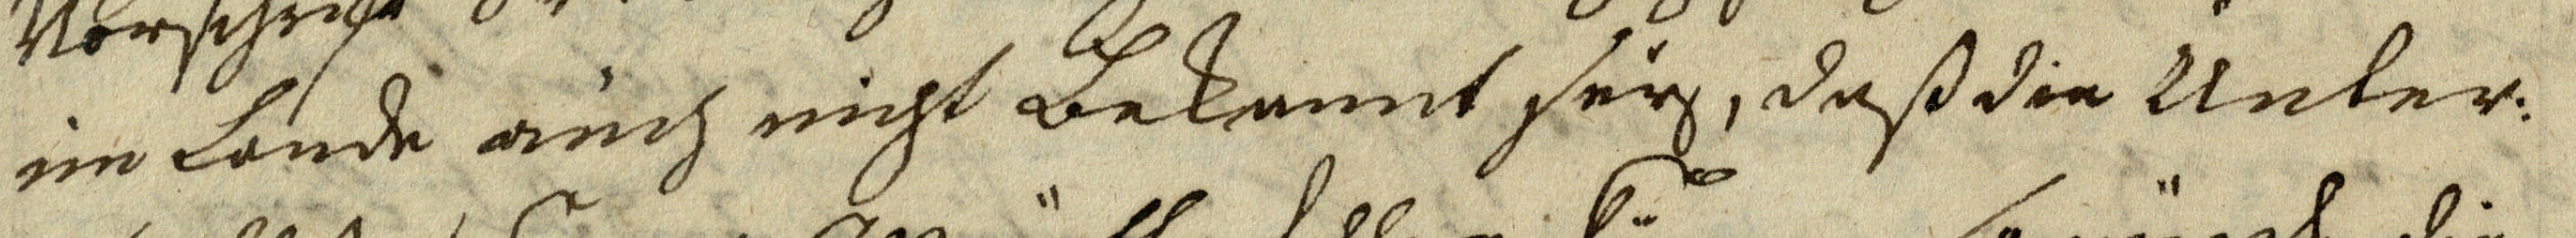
im Lande auch nicht bekannt seÿ, daß die Unter¬
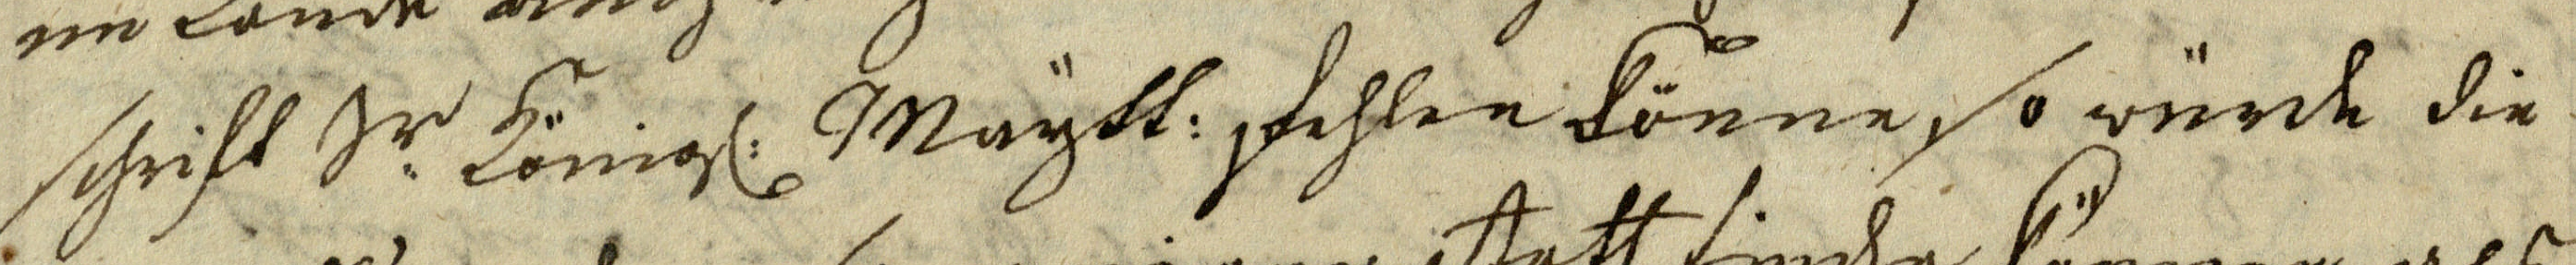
schrift Sr Königl. Maÿtt. fehlen könne, so würde die
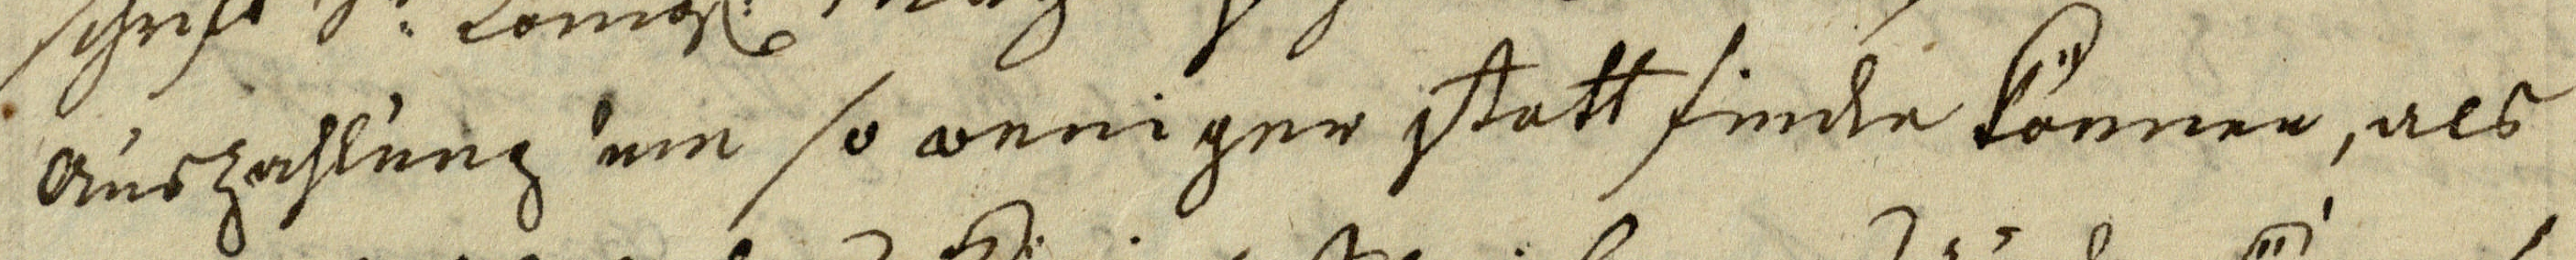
Auszahlung um so weniger statt finden können, als
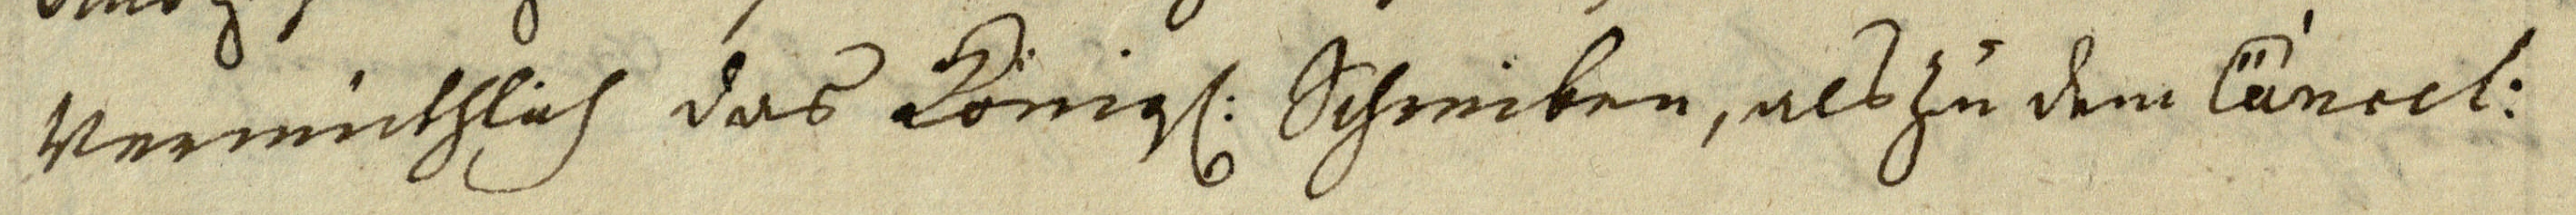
vermeintlich das Königl. Schreiben, als zu dem Cancel¬
